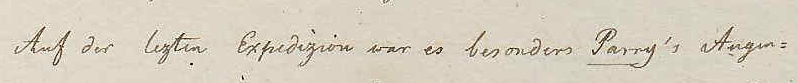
Auf der lezten Expedizion war es besonders Parry's Augen-
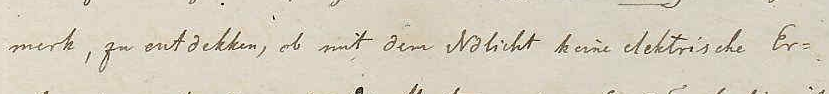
merk, zu entdekken, ob mit dem Ndlicht keine elektrische Er-
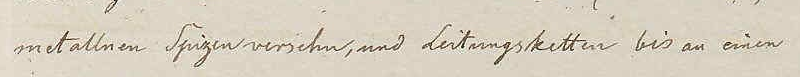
metallnen Spizen versehn, und Leitungsketten bis an einen
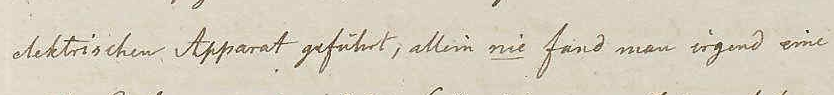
elektrischen Apparat geführt, allein nie fand man irgend eine
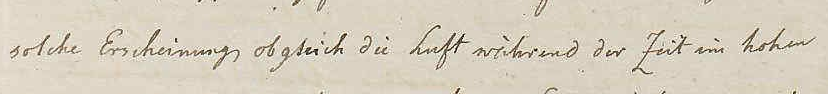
solche Erscheinung, obgleich die Luft während der Zeit im hohen
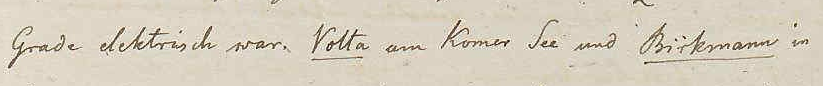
Grade elektrisch war. Volta am Komer See und Birkmann in
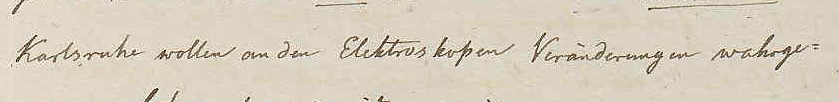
Karlsruhe wollen an den Elektroskopen Veränderungen wahrge-
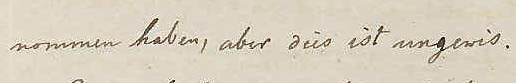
nommen haben, aber dies ist ungewis.
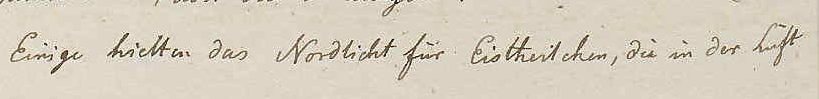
Einige hielten das Nordlicht für Eistheilchen, die in der Luft
